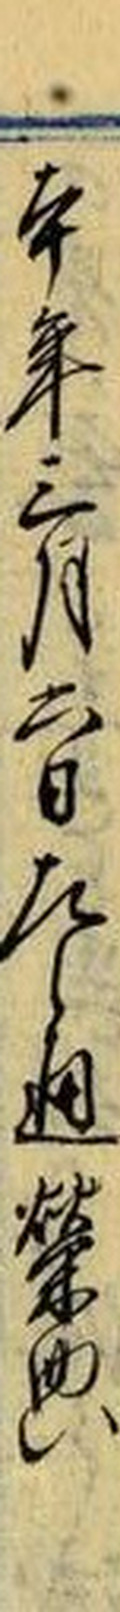本年三月六日左之通栄典
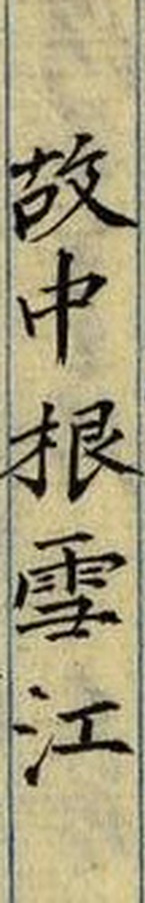故中根雪江
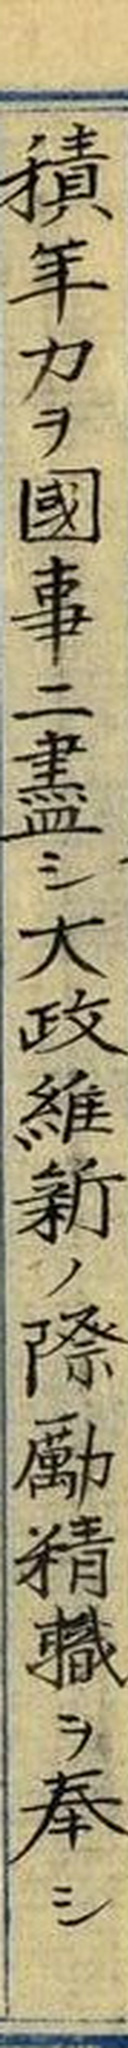積年力ヲ国事二尽シ大政維新之際励精職ヲ奉シ
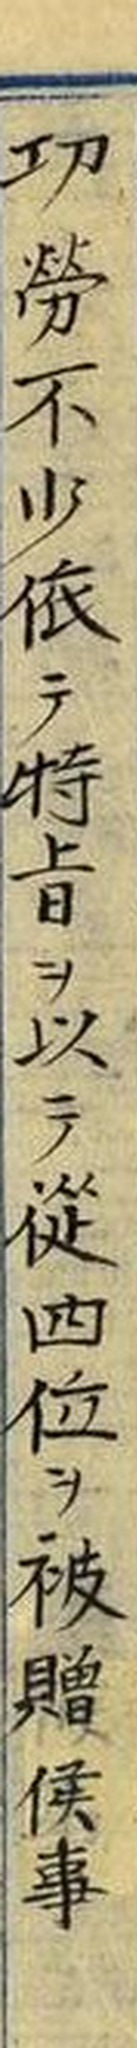功労不少依テ特旨ヲ以テ従四位ヲ被贈候事
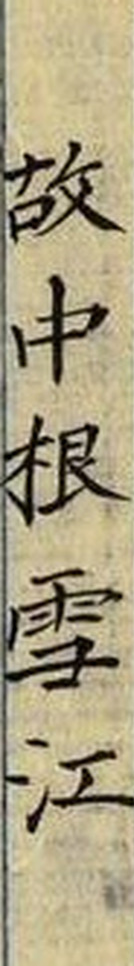故中根雪江
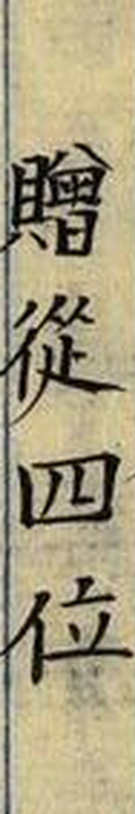贈従四位
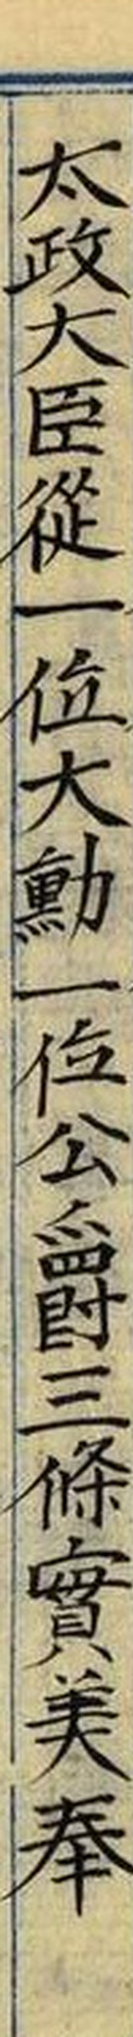太政大臣従一位大勲一位公爵三条実美奉
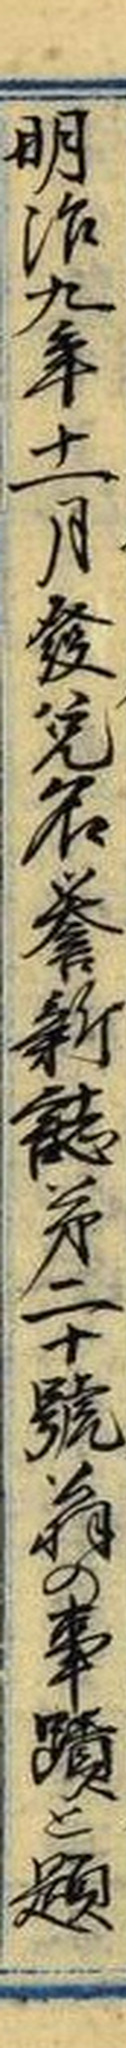明治九年十一月発兌名誉新誌第二十号翁の事績と題

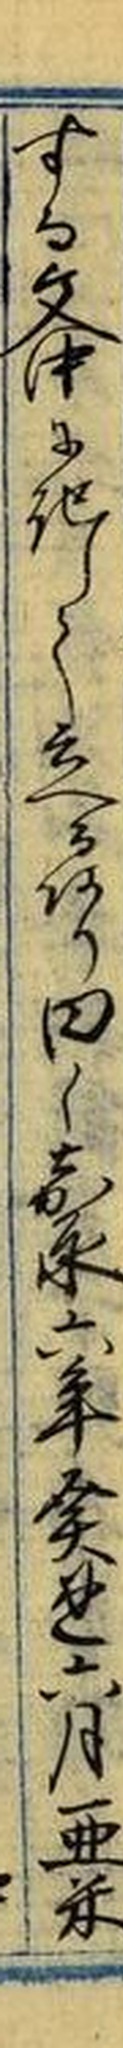する文中に記して云へるあり曰く嘉永六年癸丑六月亜米
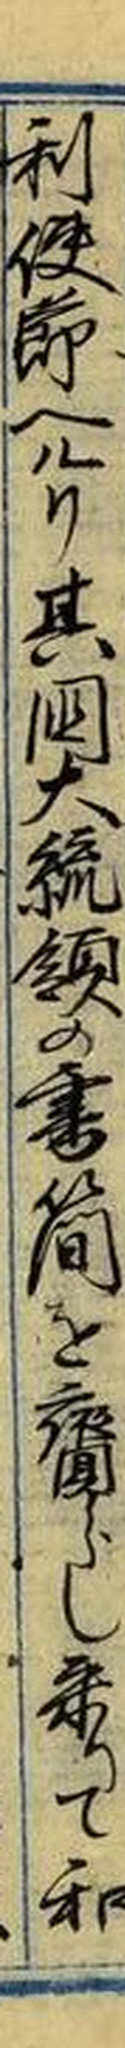利使節へルリ其国大統領の書簡を齎らし来りて和
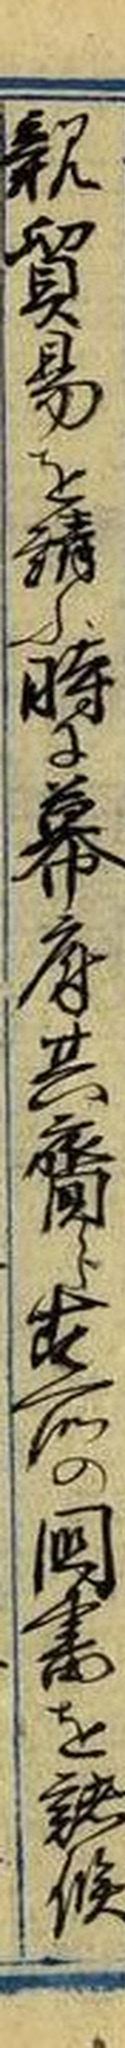親貿易を請ふ時に幕府其齎らす所の国書を諸侯
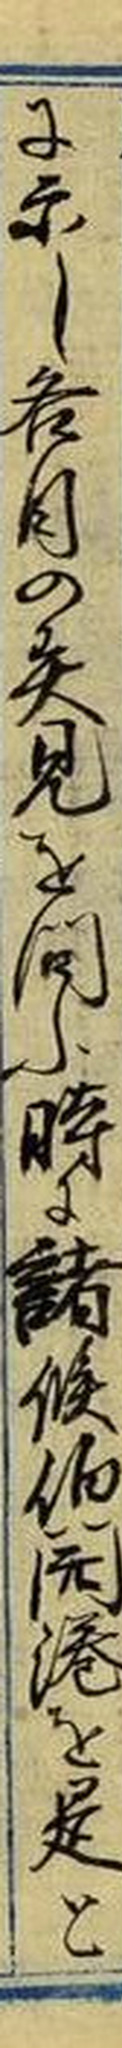に示し各自の異見を問ふ時に諸侯伯開港を是と
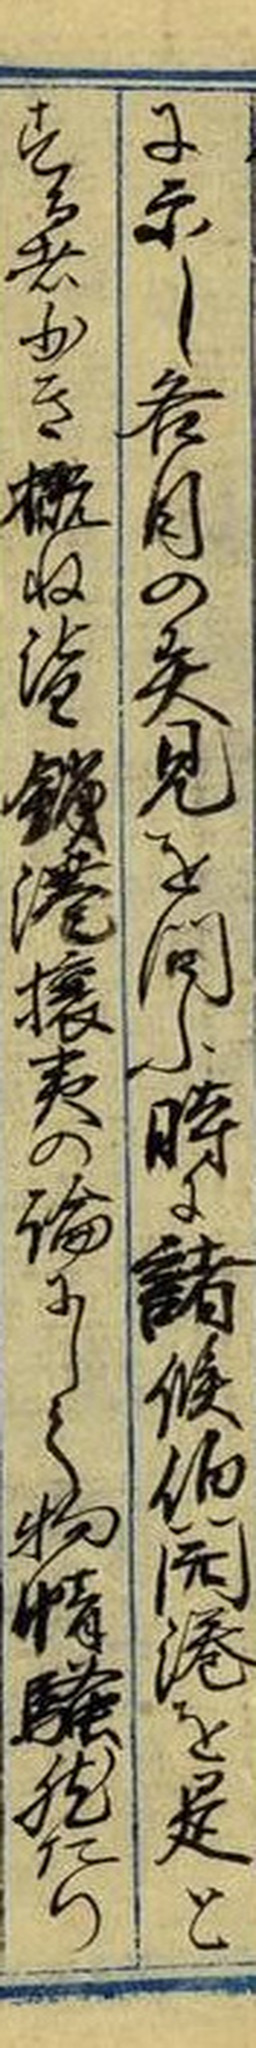する者少き概ね皆鎖港攘夷の論にして物情騒然たり
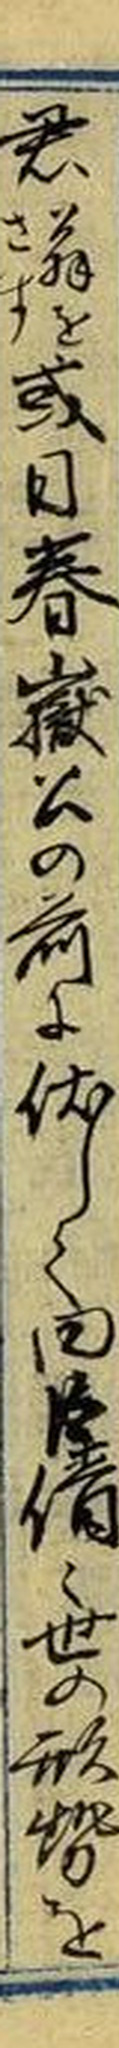君翁をさす或日春嶽公の前に伏して曰臣倩々世の形勢を
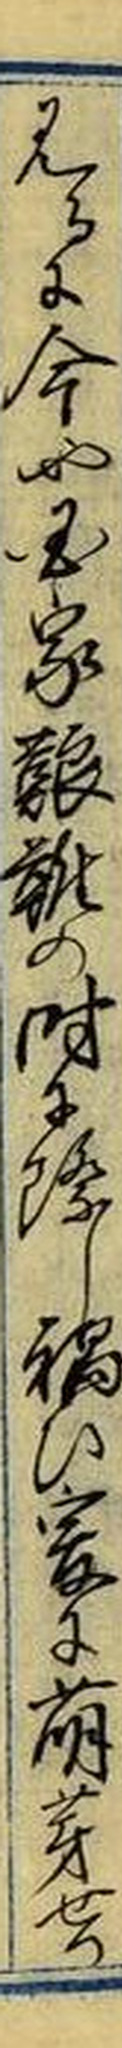見るに今や国家艱難の時に際し禍ひ爰に萌芽せり
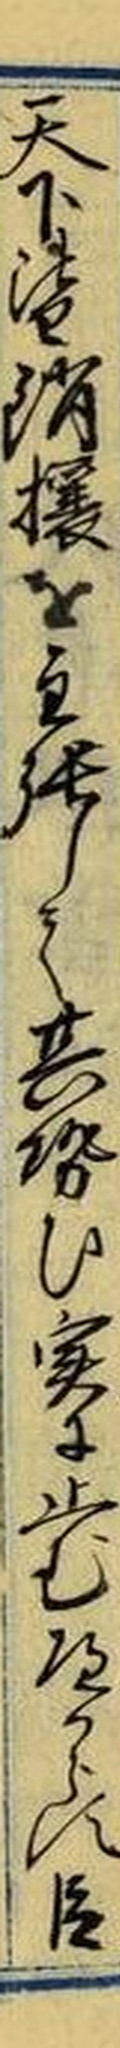天下皆消壌を主張して其勢ひ実に止むべからす臣
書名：温古集 三巻
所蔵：福井県文書館 Fukui Prefectural Archives
